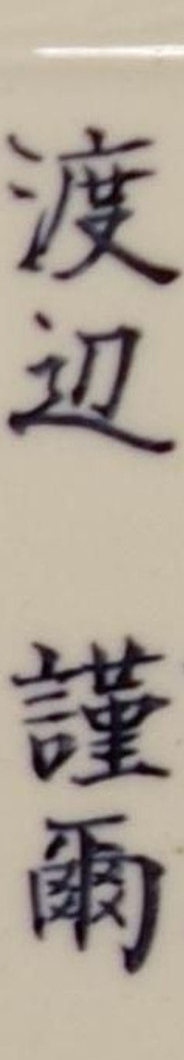渡辺謹爾
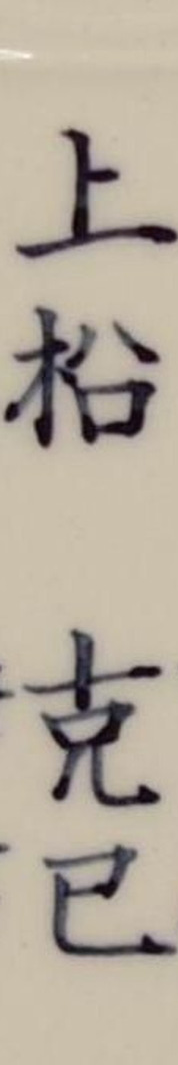上松克己
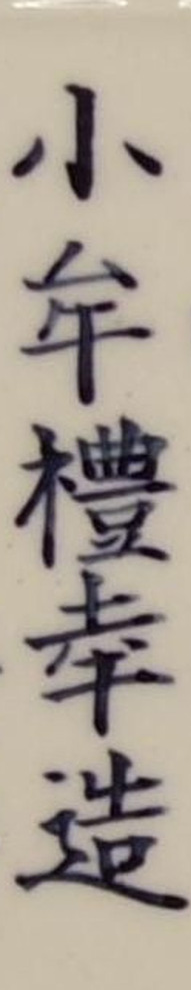小牟禮幸造
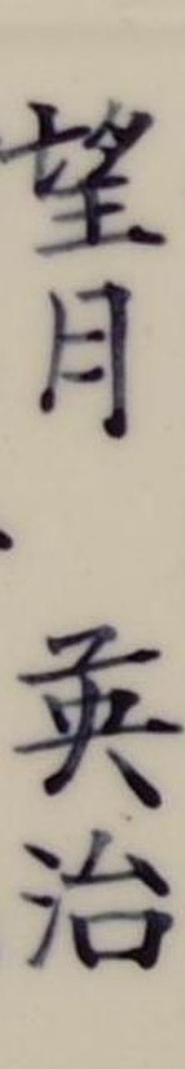望月英治
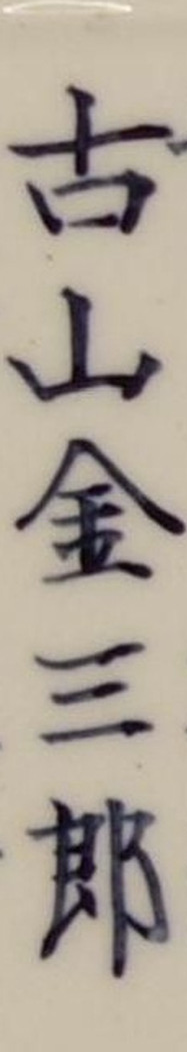古山金三郎
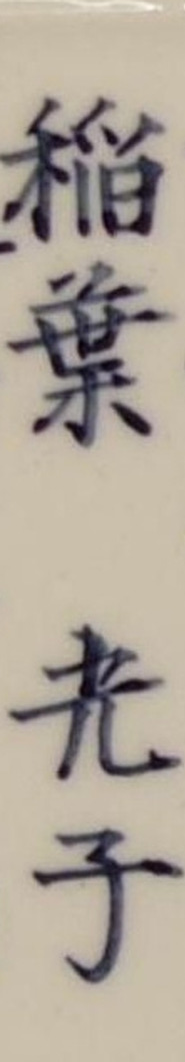稲葉光子
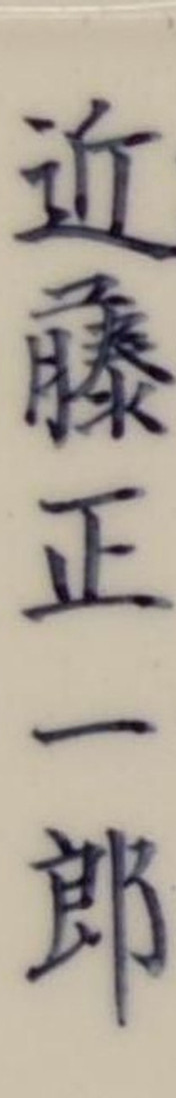近藤正一郎

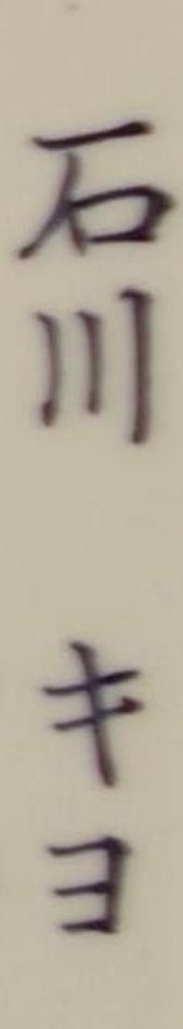石川キヨ
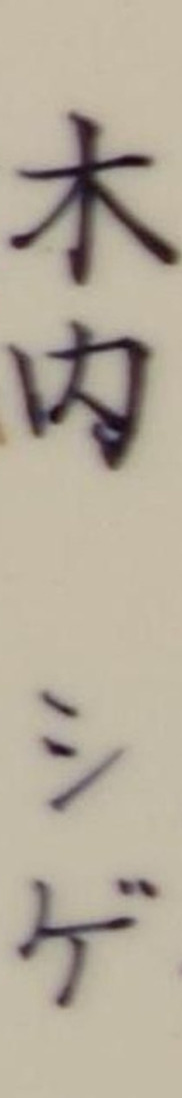木内シゲ
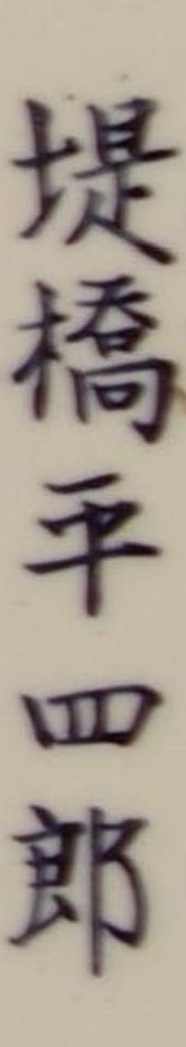堤橋平四郎
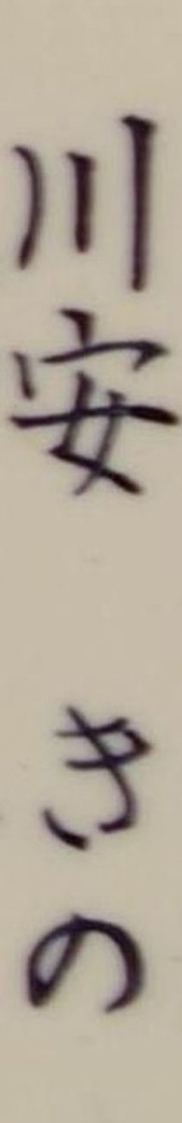川安きの
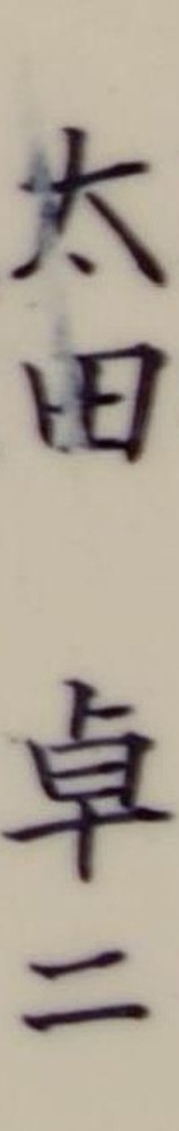太田卓二
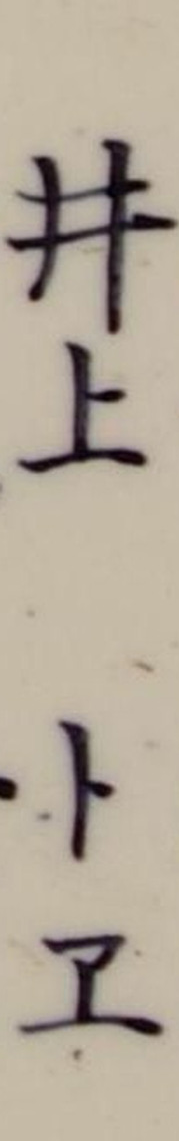井上トエ
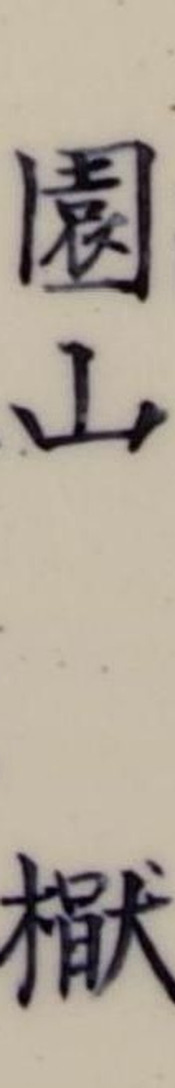園山橄
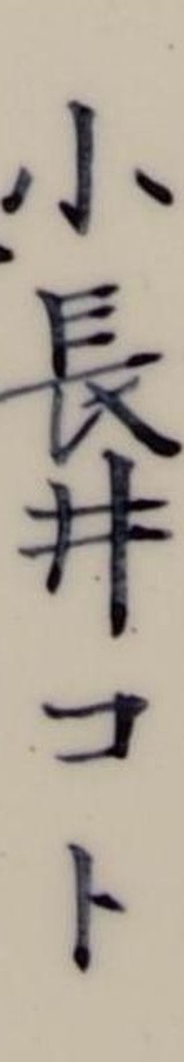小長井コト
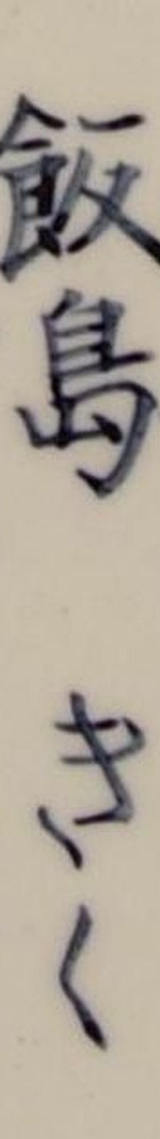飯島きく
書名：M~S
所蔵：高野山金剛峯寺
